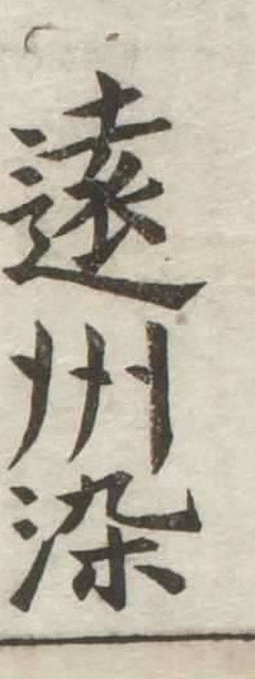遠州染
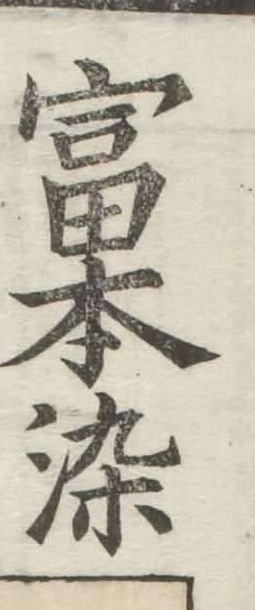富本染
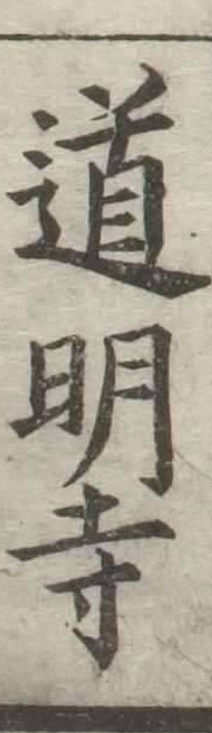道明寺
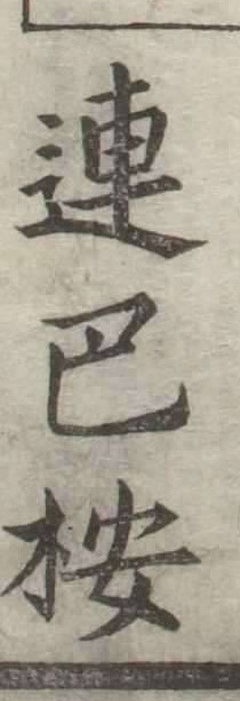連巴案

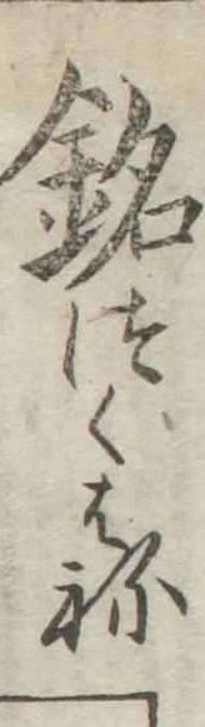銘つくはね
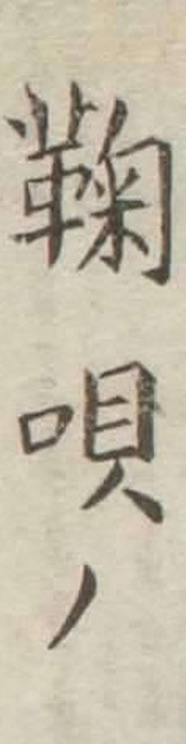鞠唄の
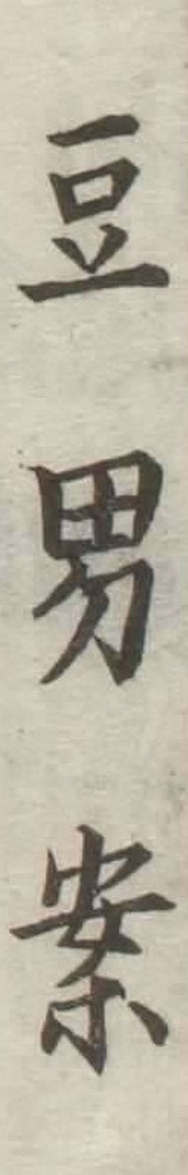豆男案
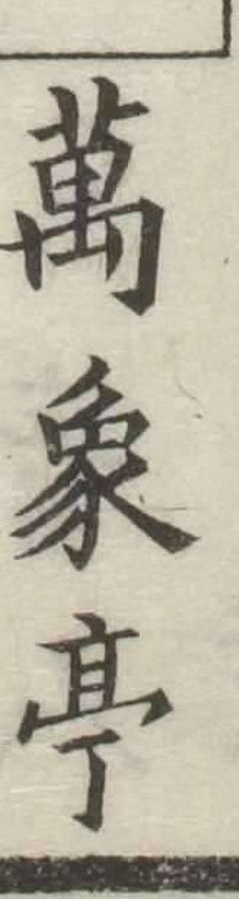萬象亭
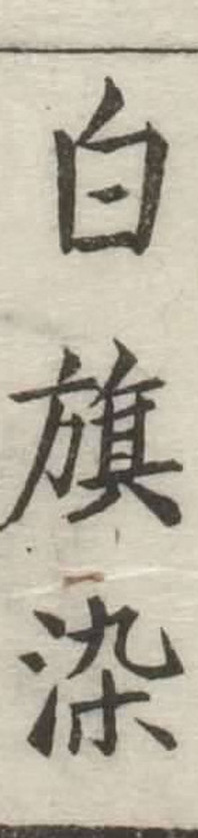白旗染
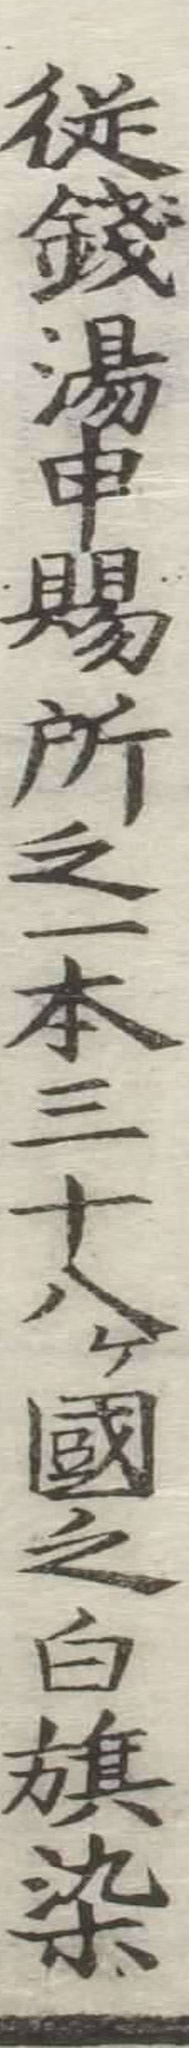従銭湯申賜所之一本三十八ヶ国之白旗染
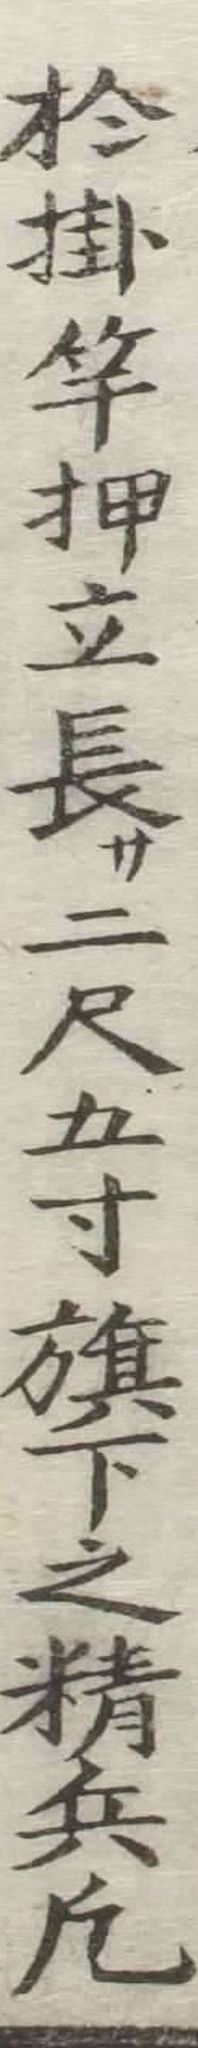於掛竿押立長さ二尺五寸旗下之精兵凡
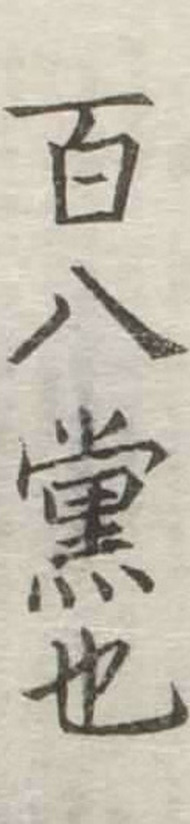百八党也
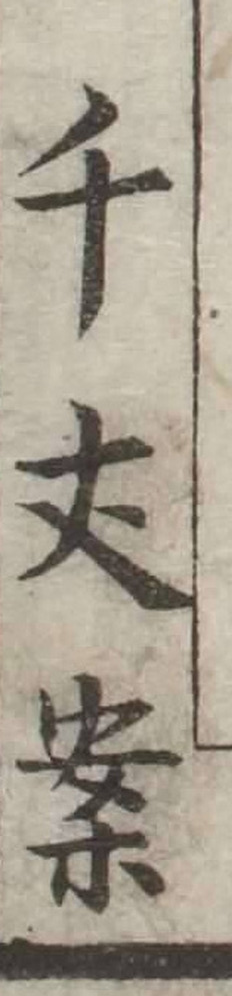千丈案

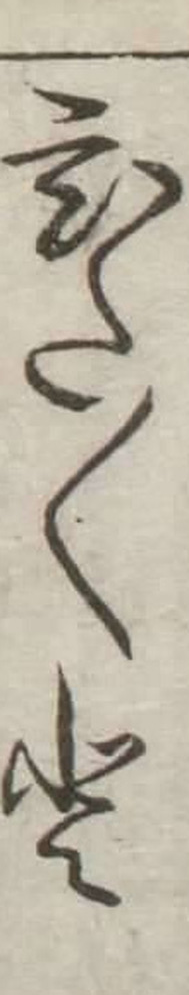ひた〳〵と
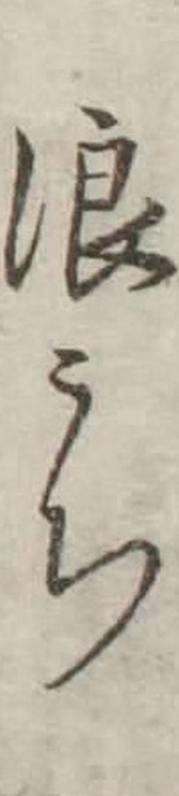浪うち
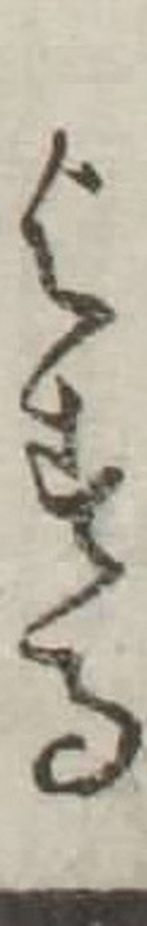よする
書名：たなくひあわせ
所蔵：国文学研究資料館
